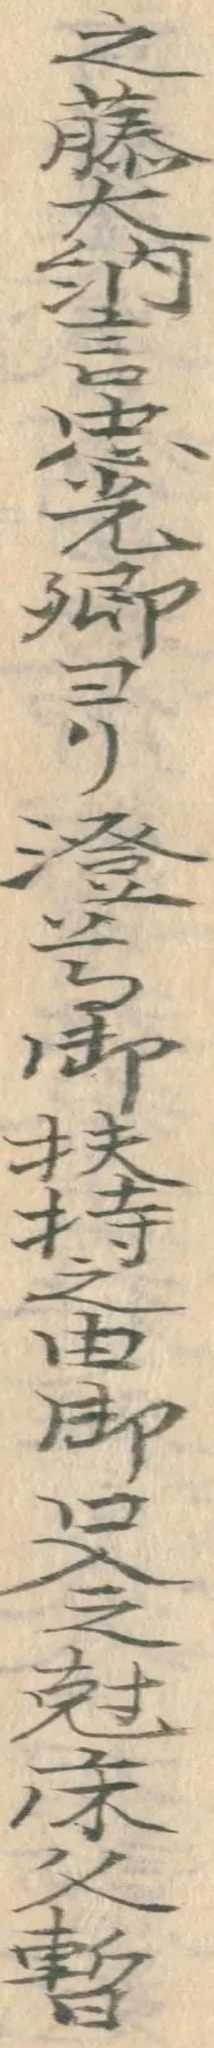之藤大納言忠光卿ヨリ澄尊御扶持之由御口入之尅床久暫
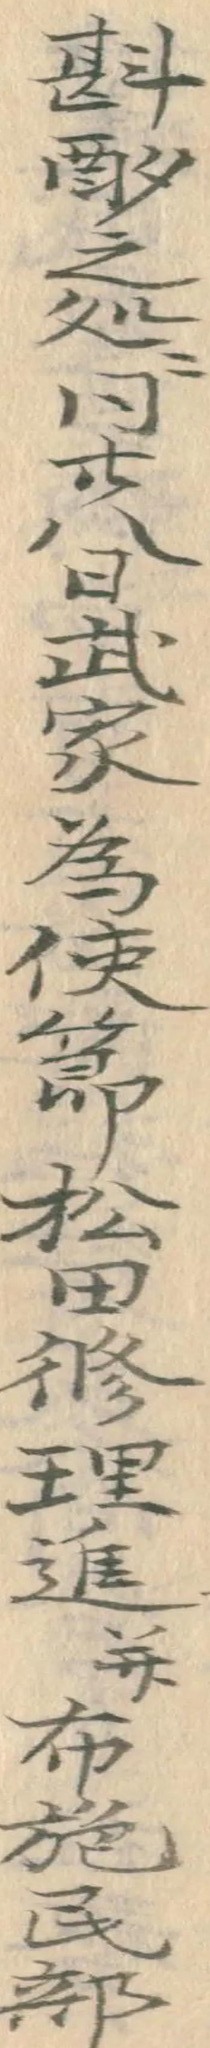斟酌之処ニ同廿八日武家為使節松田修理進并布施民部
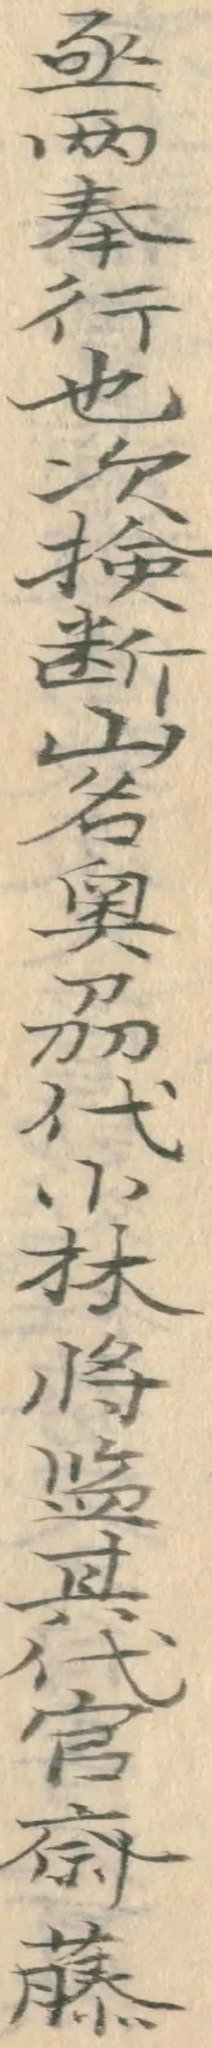丞両奉行也次検断山名奥州代小林将監其代官斉藤
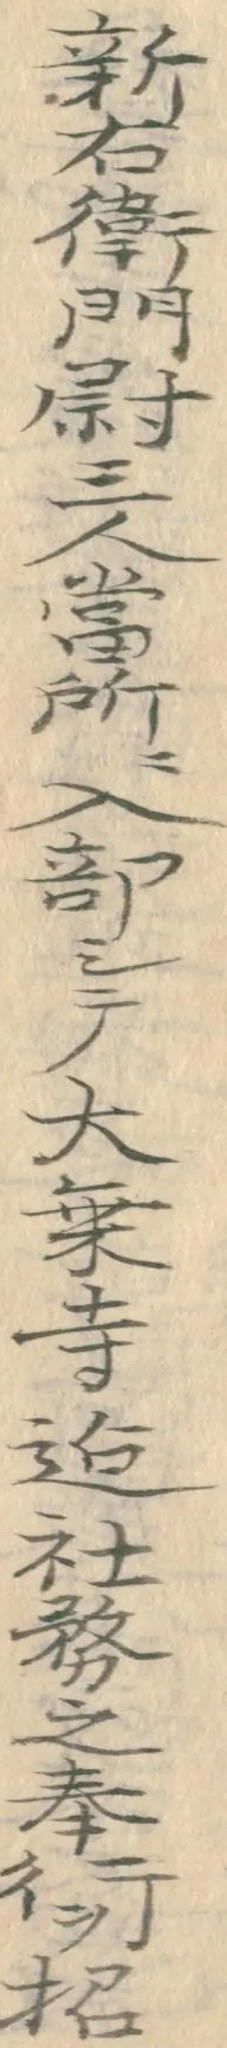新右衛門尉三人当所ニ入部シテ大乗寺迄社務之奉行ヲ招
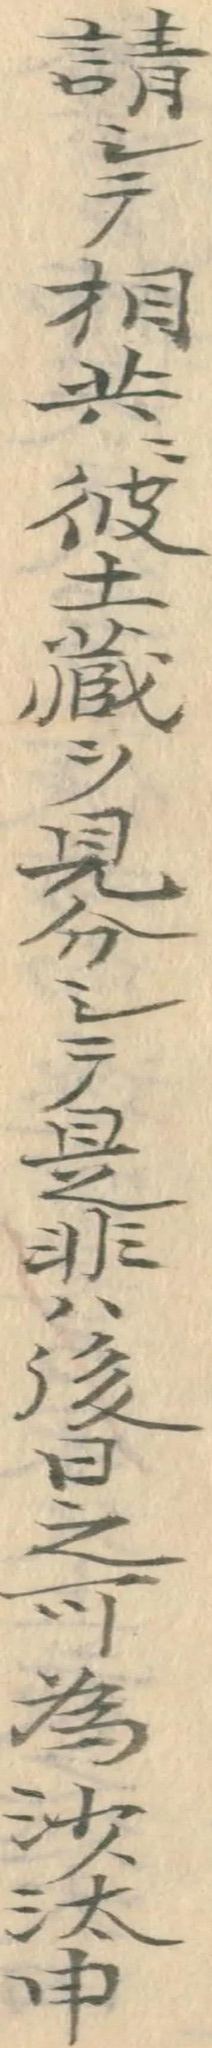請シテ相共ニ彼土蔵ヲ見分シテ是非ハ後日之可為沙汰申
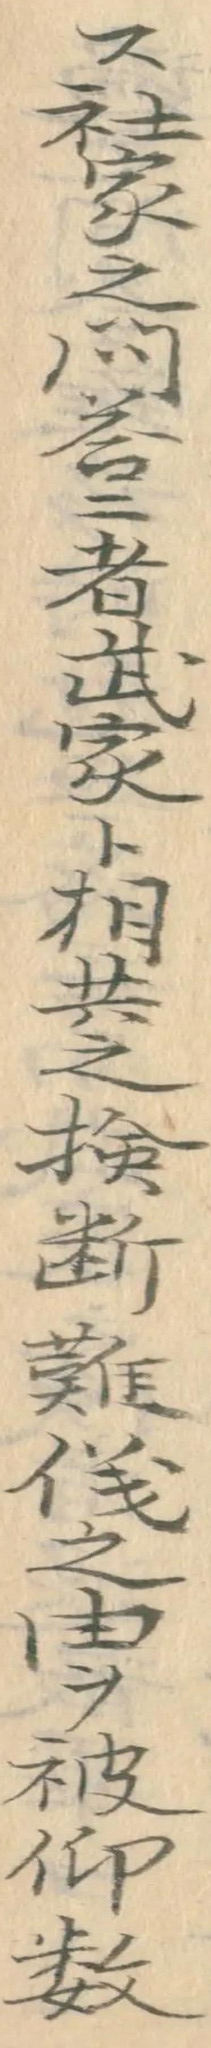ス社家之問答ニ者武家ト相共之検断難儀之由ヲ被仰数

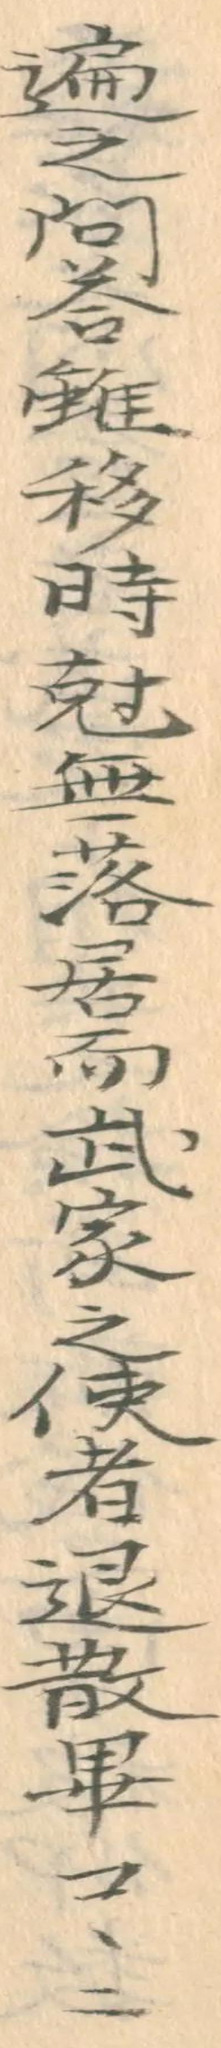遍之問答雖移時尅無落居而武家之使者退散畢コヽニ
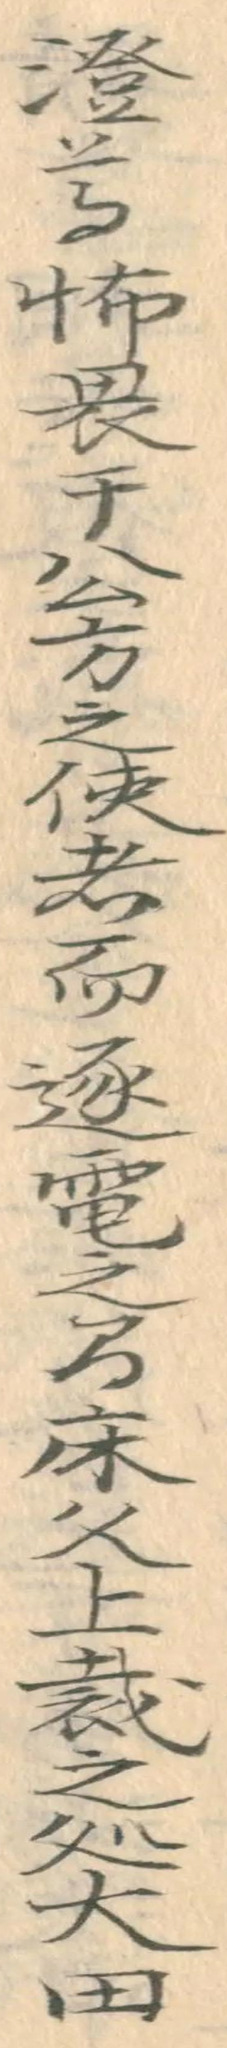澄尊怖畏于公方之使者而逐電之間床久上裁之処大田
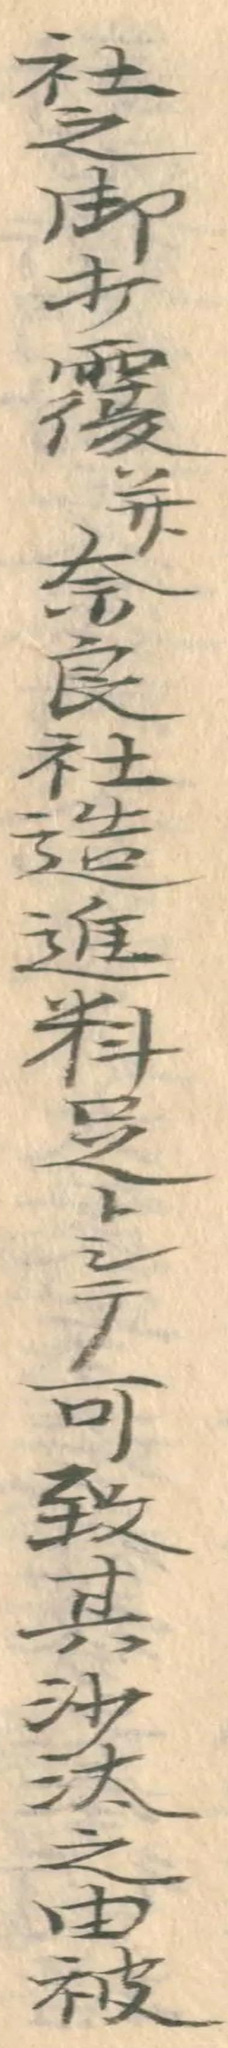社之御打覆并奈良社造進料足トシテ可致其沙汰之由被
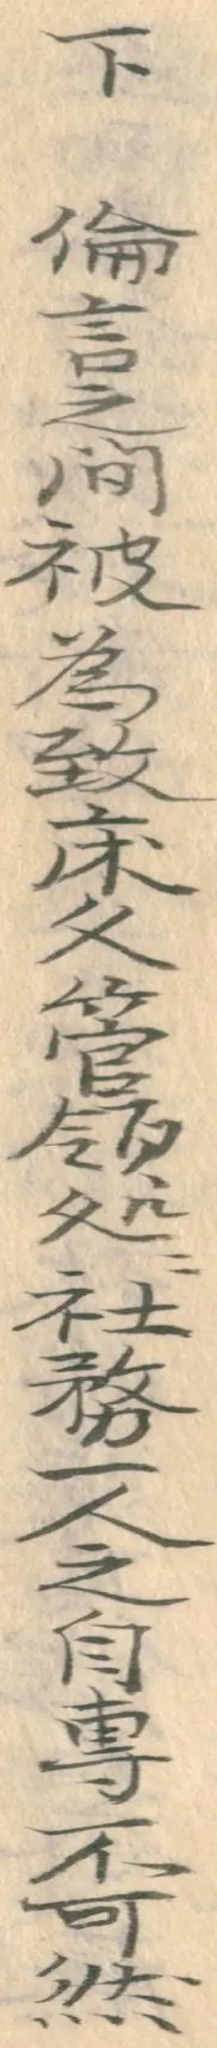下倫言之間被為致床久管領処ニ社務一人之自専不可然
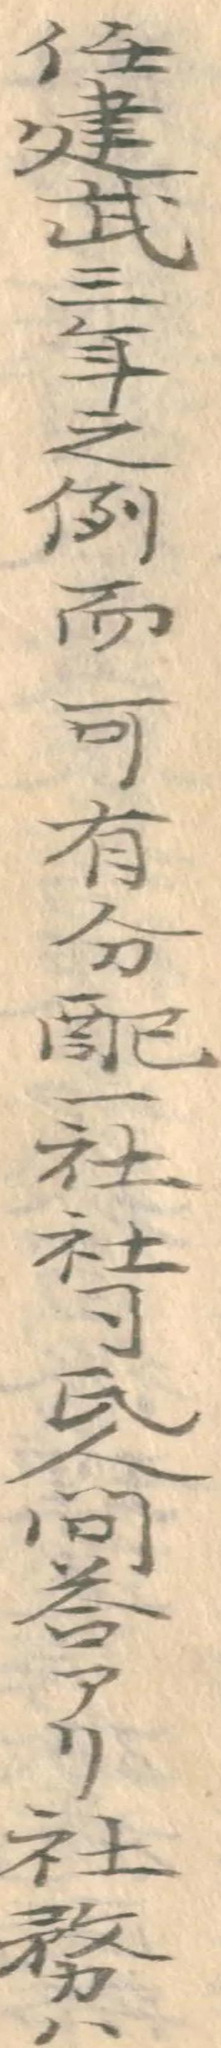任建武三年之例而可有分配一社社司氏人問答アリ社務ハ
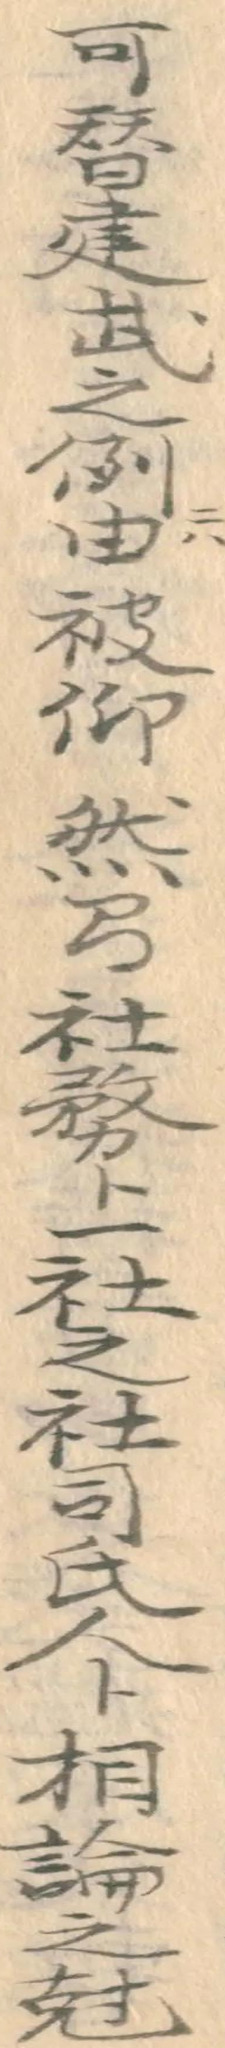可替建武之倒由被仰然間社務ト一社之社司氏人ト相論之尅
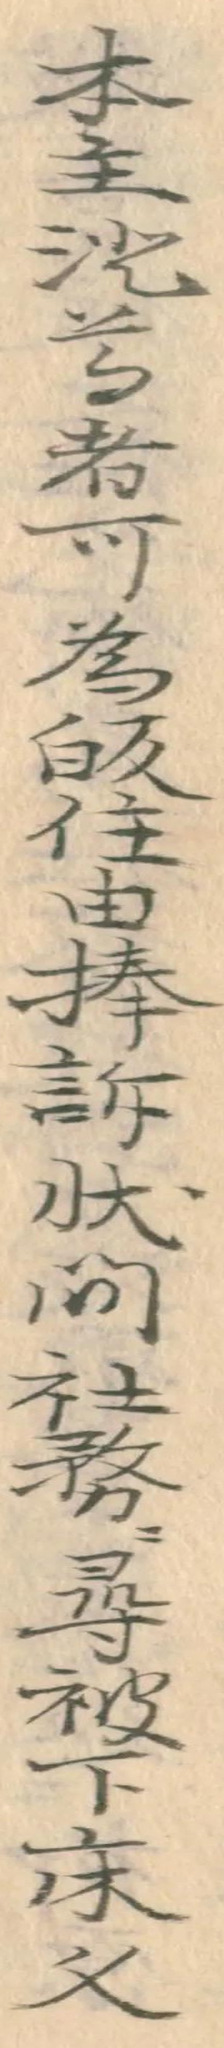本主澄尊者可為皈住由捧訴状間社務ニ尋被下床久
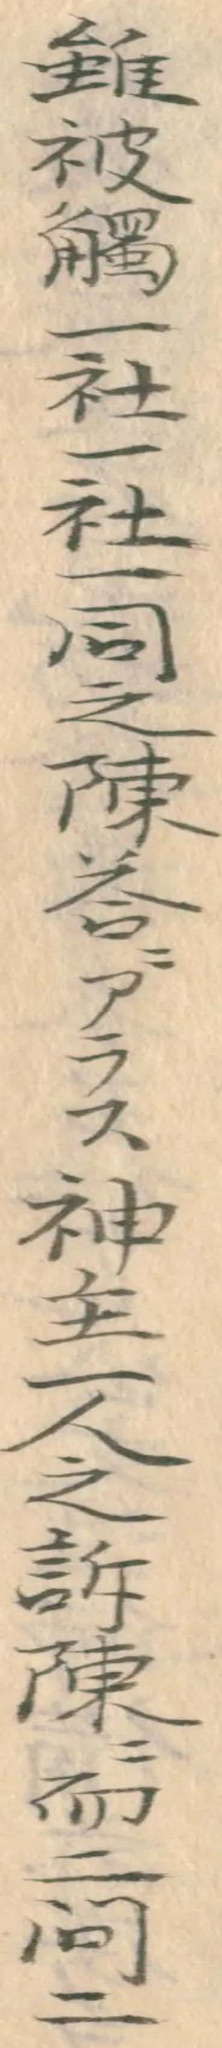雖被触一社一社一同之陳答ニアラス神主一人之訴陳ニ而二問二
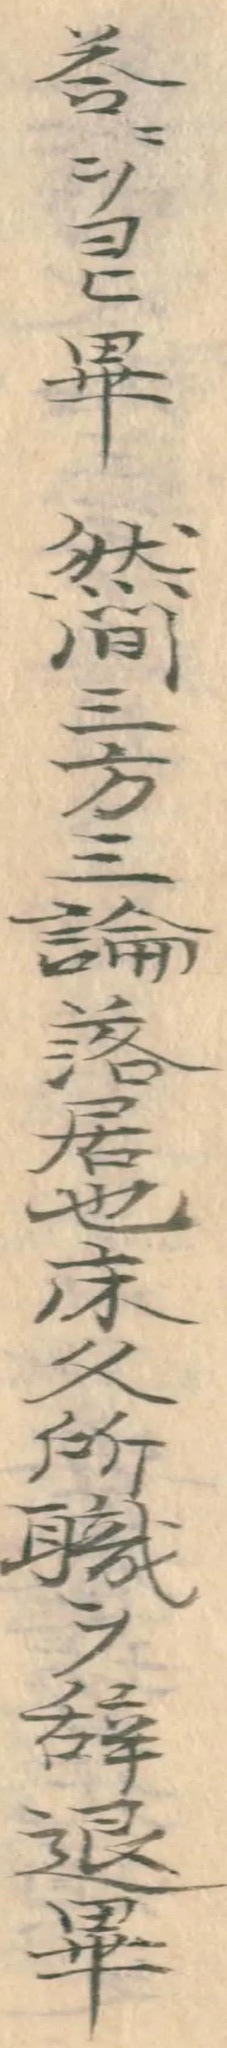答ニヲヨヒ畢然間三方三論落居也床久所職ヲ辞退畢
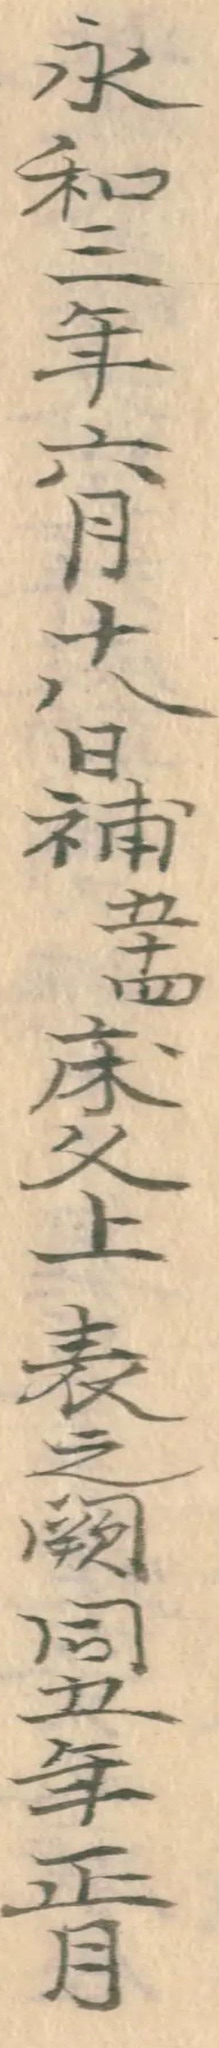永和三年六月十八日補五十四床久上表之闕同五年正月
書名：賀茂社記録. 第24冊
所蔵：国立国会図書館 National Diet Library, JAPAN
